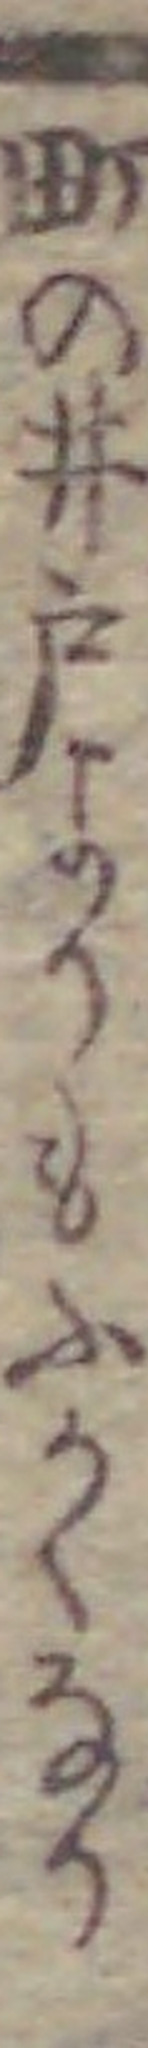町の井戸よりもふかくなり
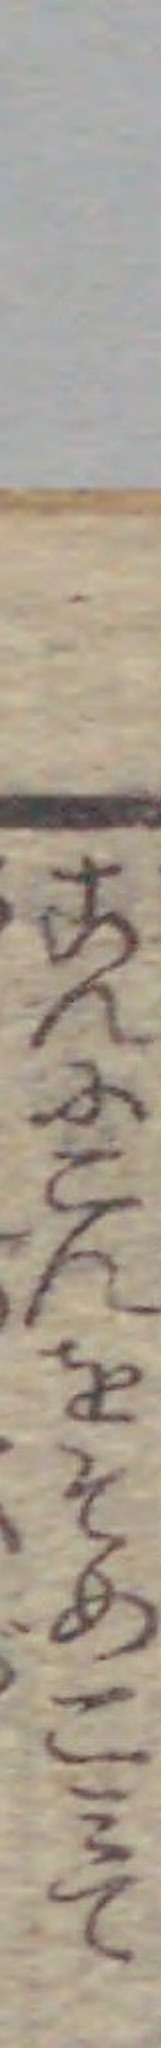こんにこんをそめこみて
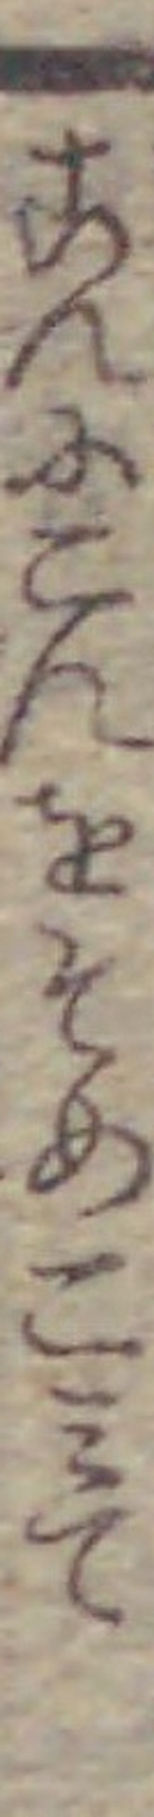こんにこんをそめこみて
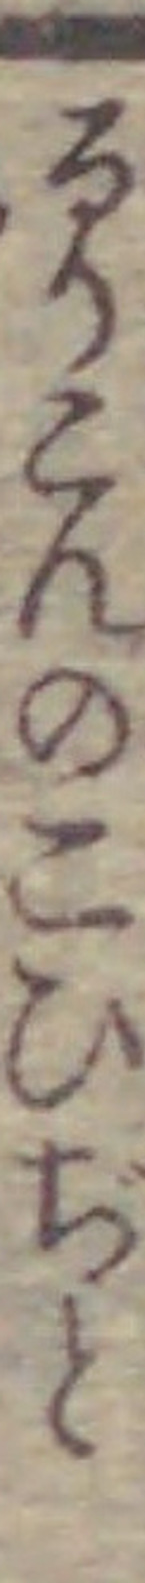るりこんのこひぢと
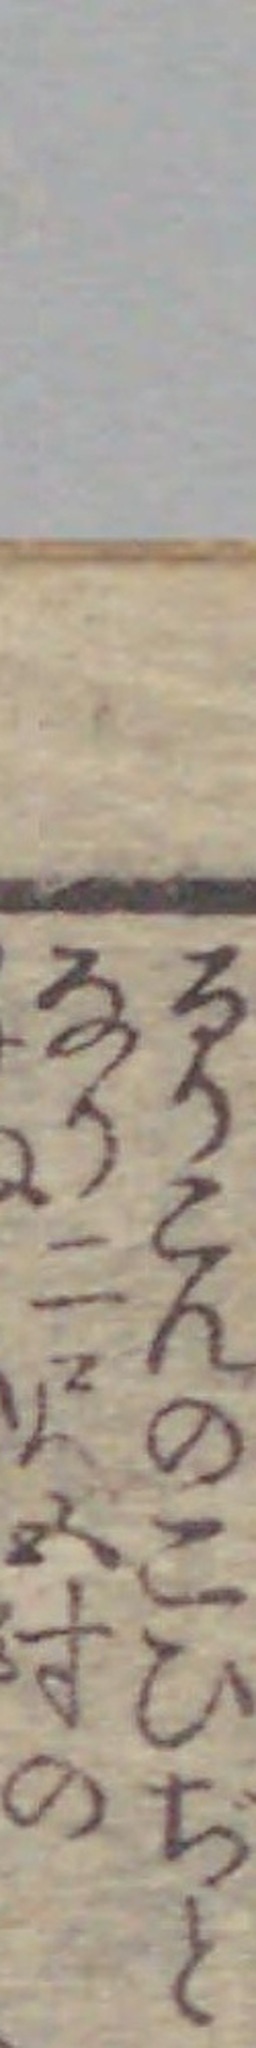なり二尺五寸の
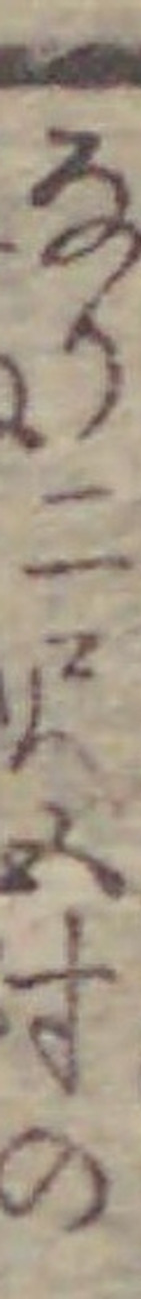なり二尺五寸の
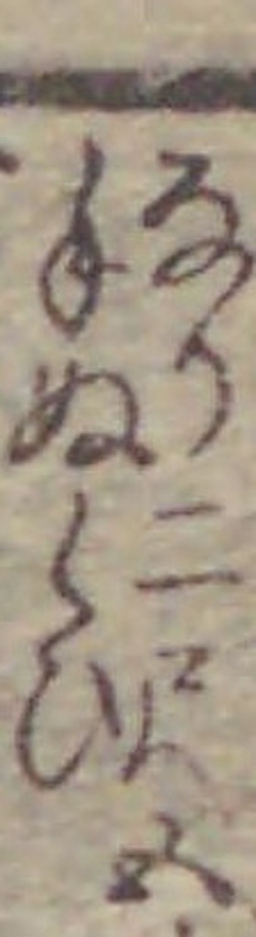手ぬくひ
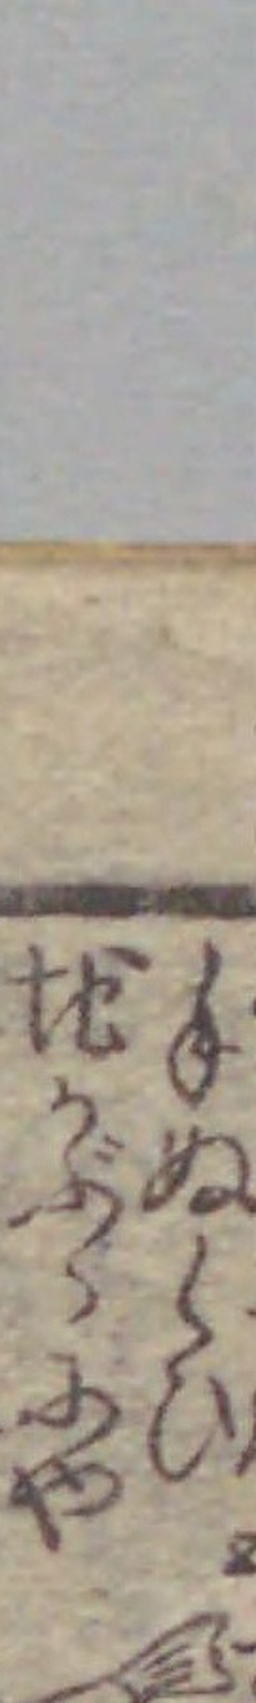地かぶらにや
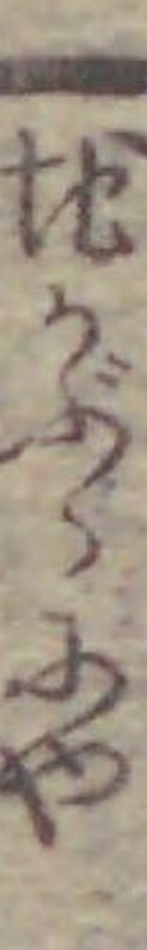地かぶらにや
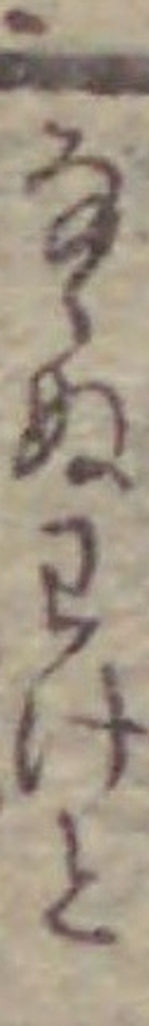ならぬわけと
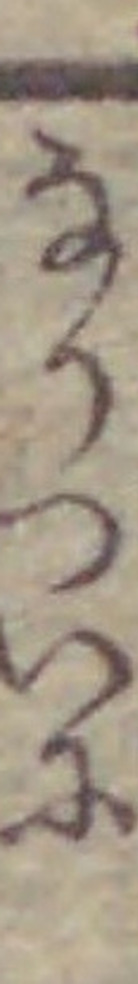なりついに
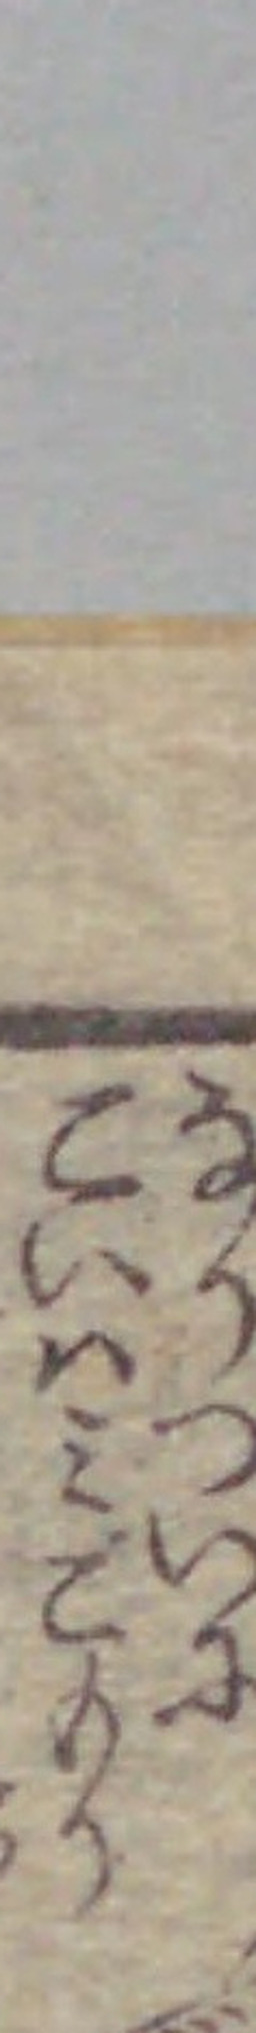こいはみごもり
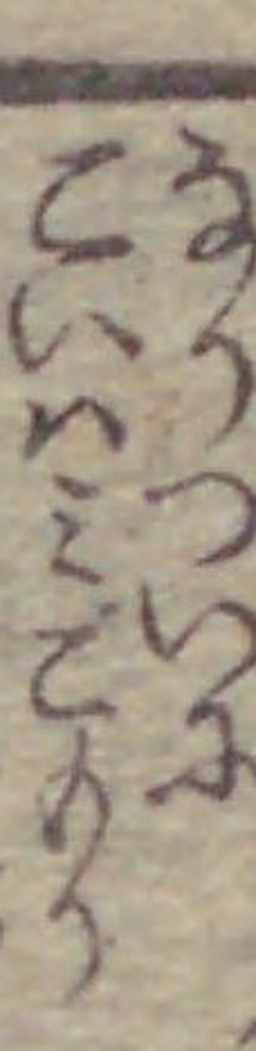こいはみごもり
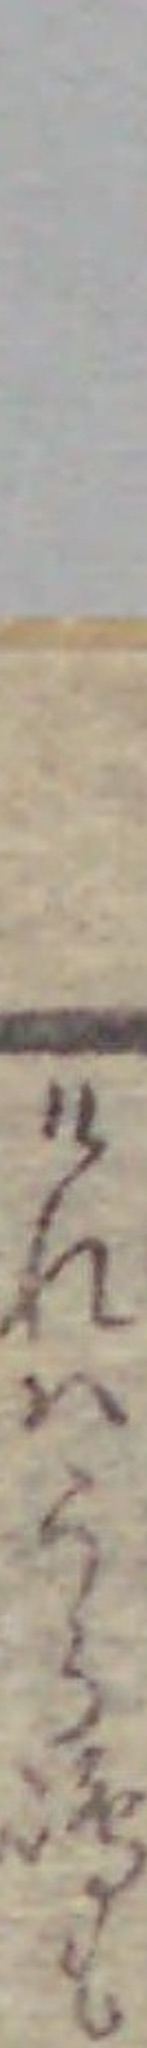けれはうら島も
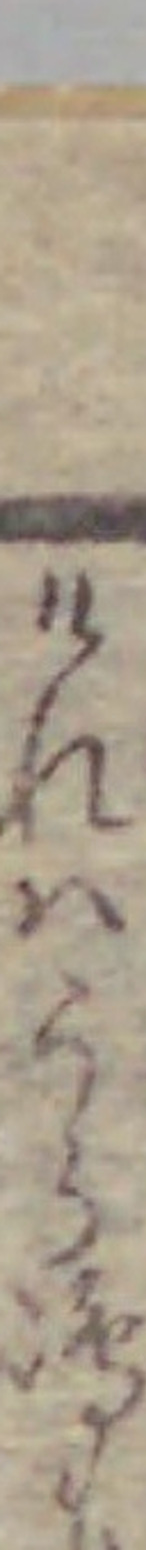けれはうら島も
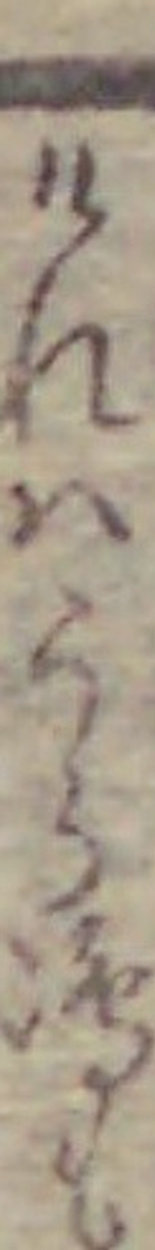けれはうら島も
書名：箱入娘面屋人魚 3巻
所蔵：国立国会図書館 National Diet Library, JAPAN
